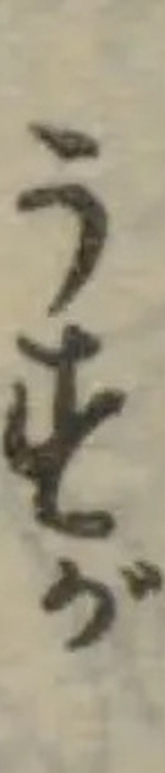うすが
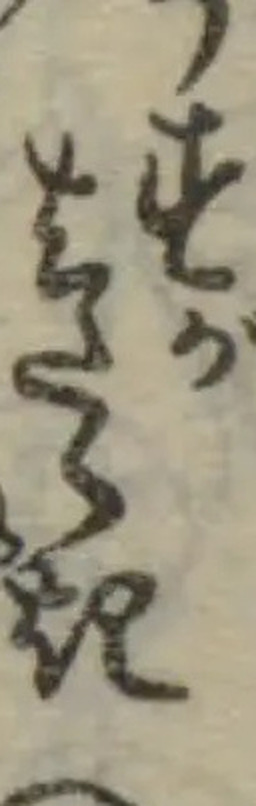はたらき
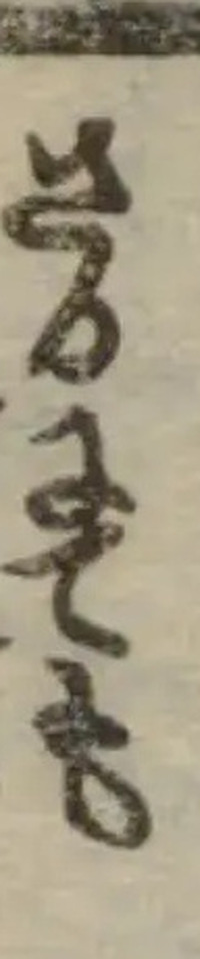さるにても
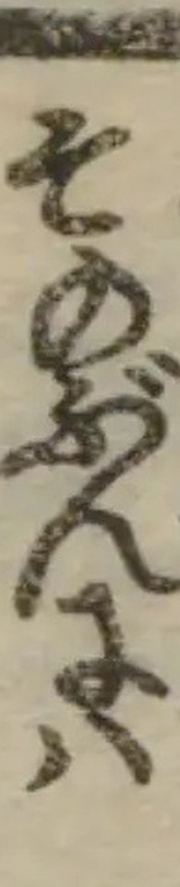そのぶんには
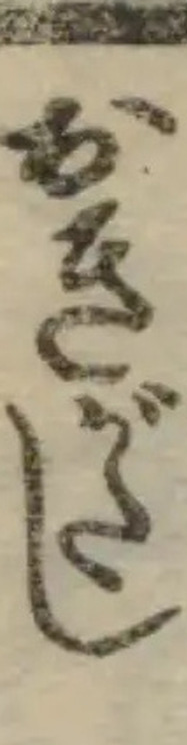おきがたし
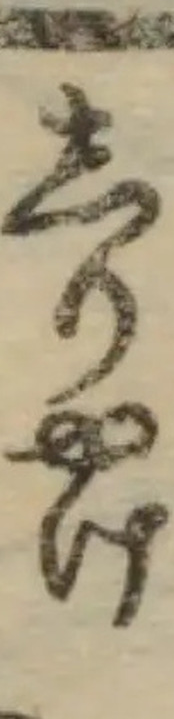しりやけ
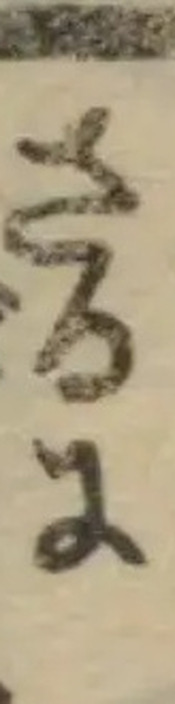さるに
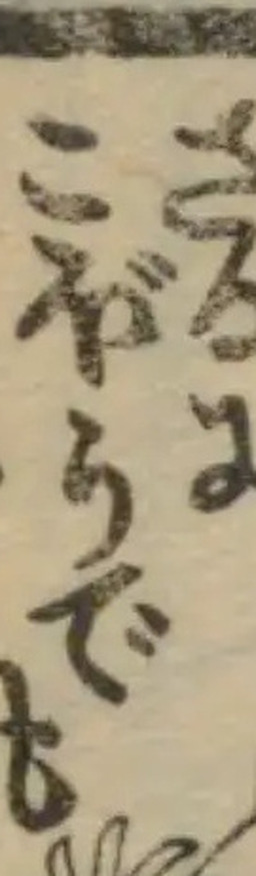こぼうでも
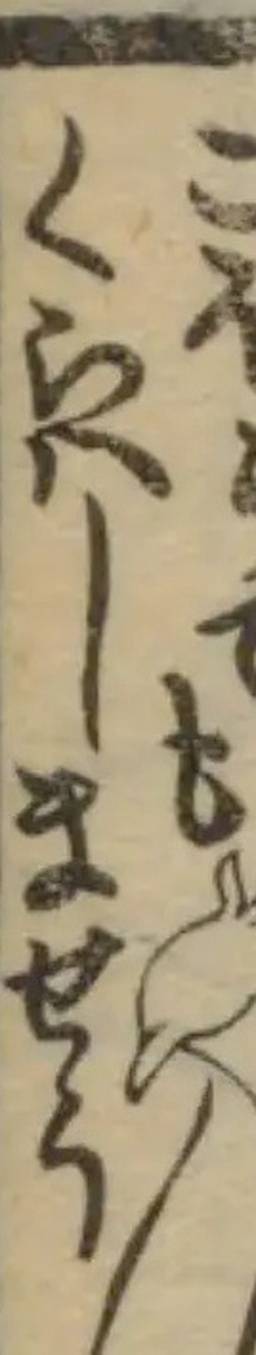くらはしませう
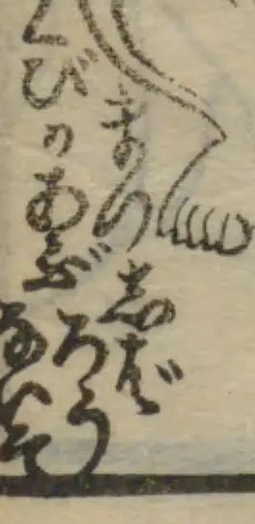くびかあぶ
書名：さるかに合戦
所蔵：国立国会図書館 National Diet Library, JAPAN
